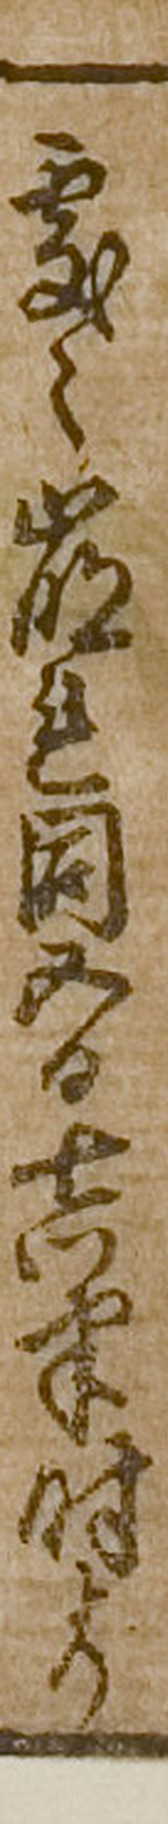處々崩れ同五日七ツ半時より
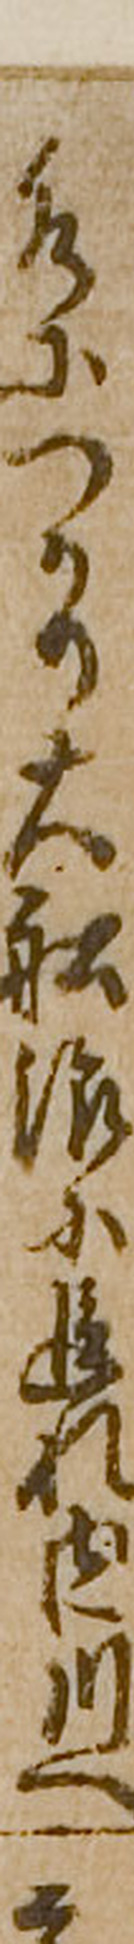水につかり大船浪に追れ内川へ
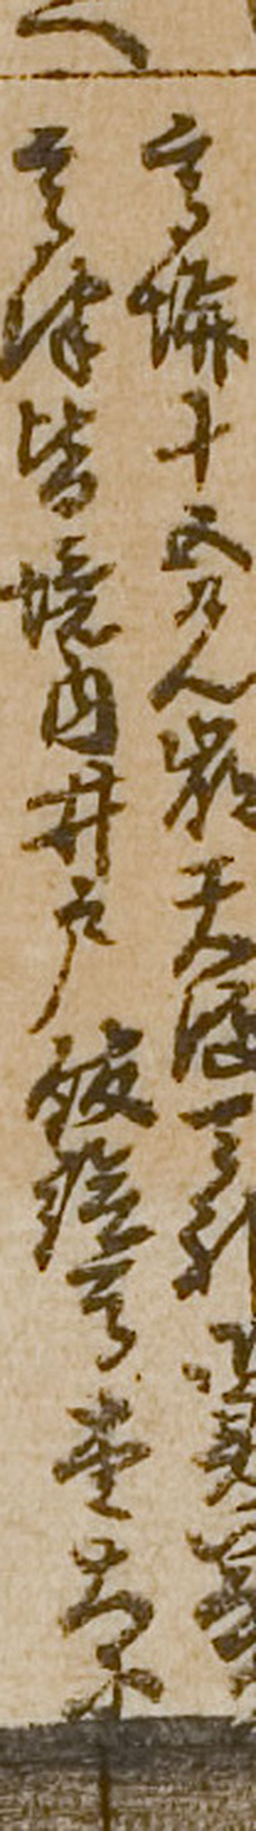高津皆境内井戸館絵馬堂大に
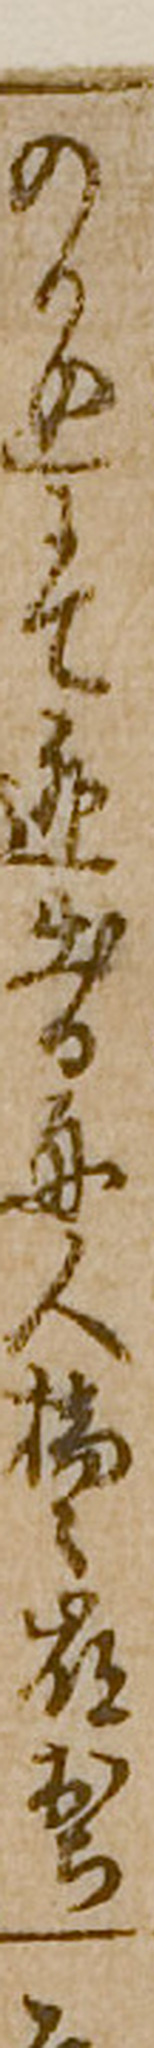のり込にて逃出る舟人橋々崩おち
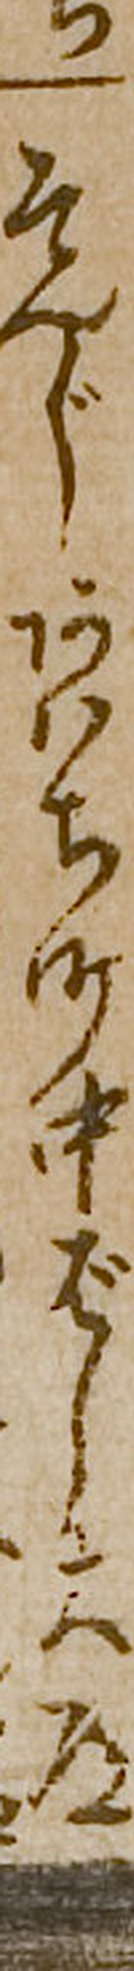そんじあハち町中ばし大道
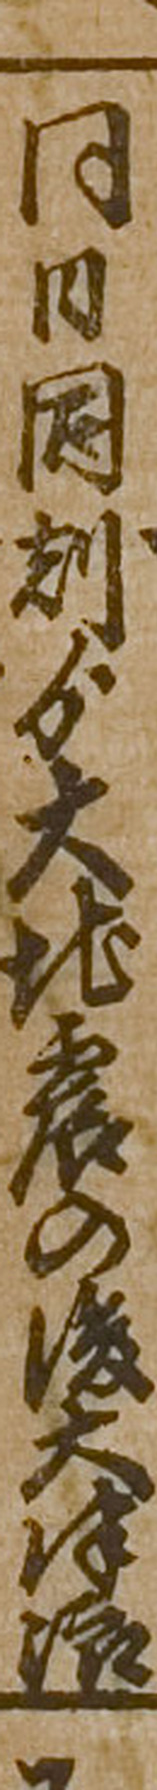同日同刻より大地震の後大津浪
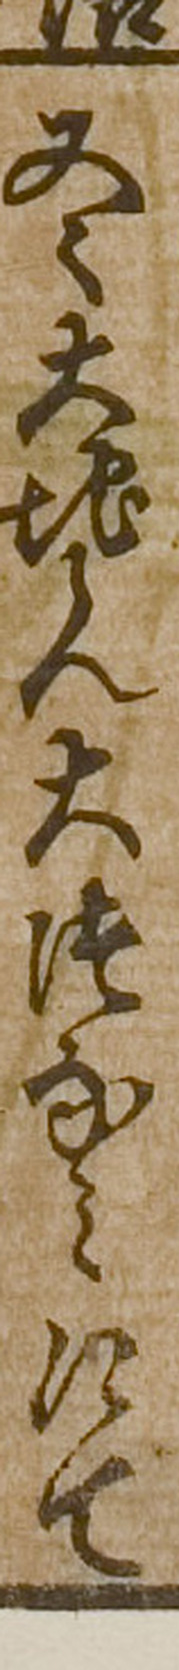又々大地しん大つなみにて
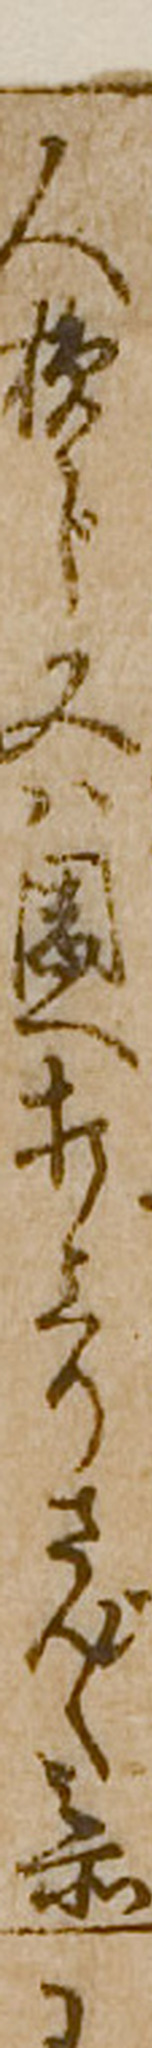人損じ又ハ岡へ打上りさん〴〵之所
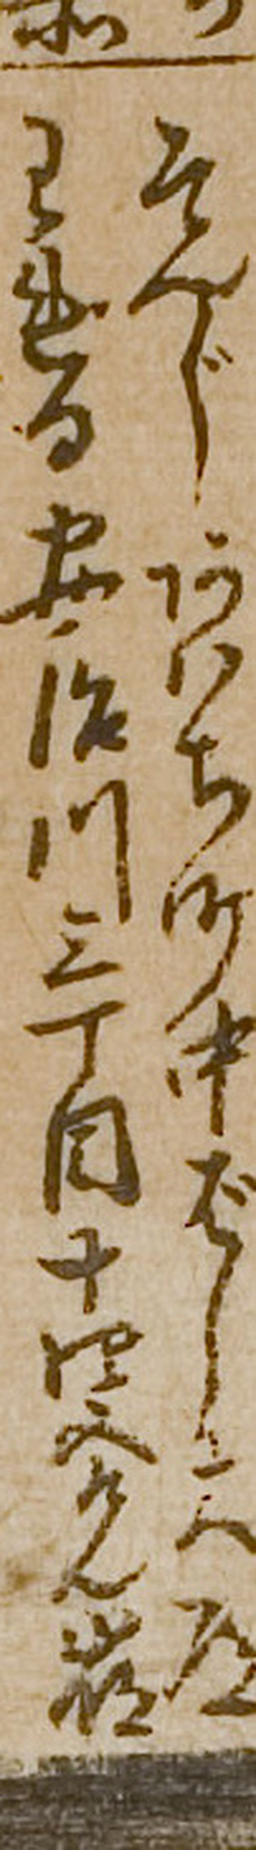われる安治川三丁目十四五けん崩
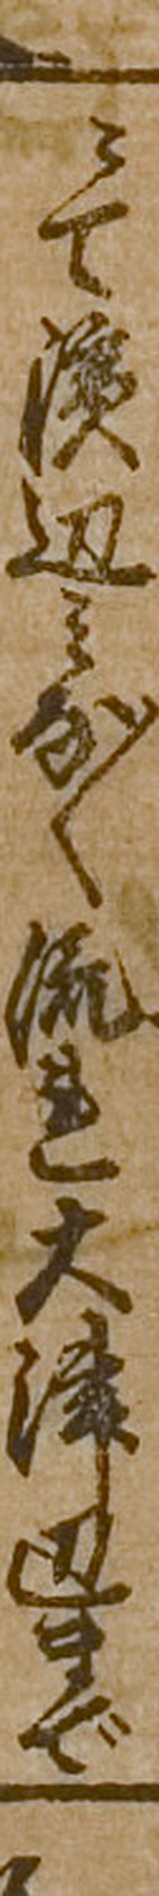二て浜辺ミな〳〵流れ大津辺まで
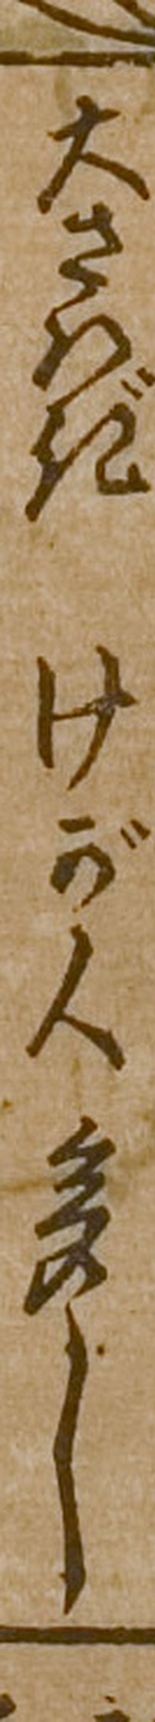大さハぎけが人多し
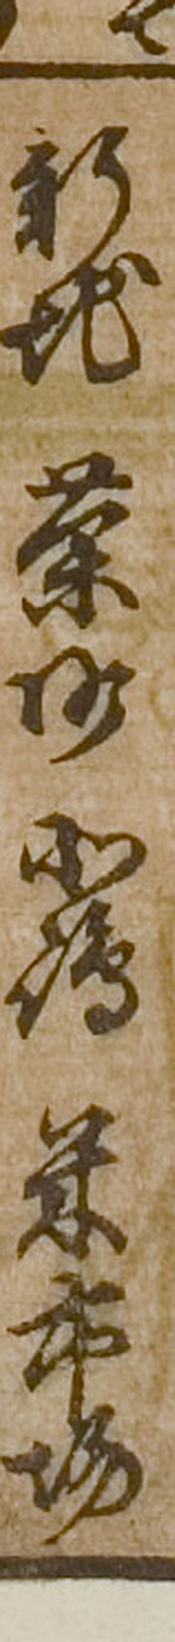新地茶町北嶋米市場
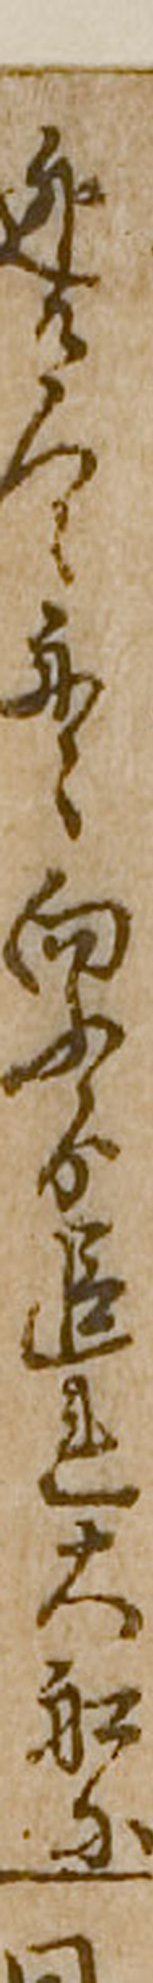逃る人々舟々向ふゟ追れ大船に
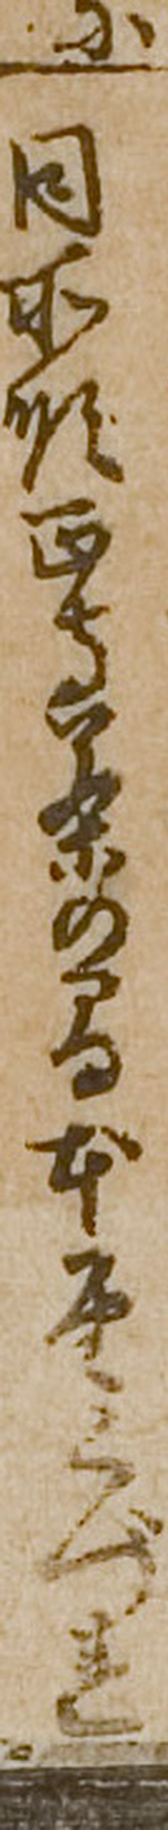同所順正寺茶の間本堂くづれ
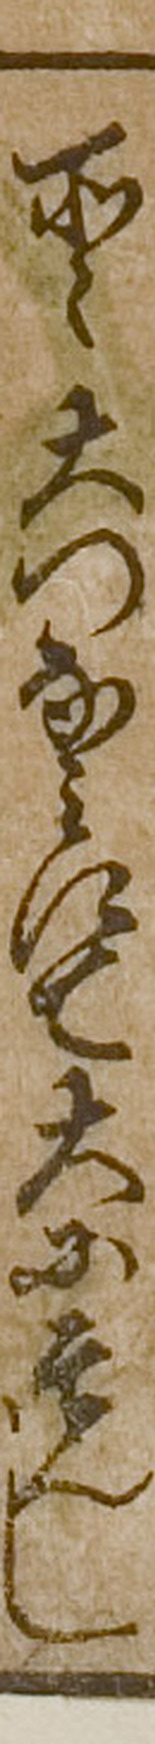所々大つなミにて大にそんし
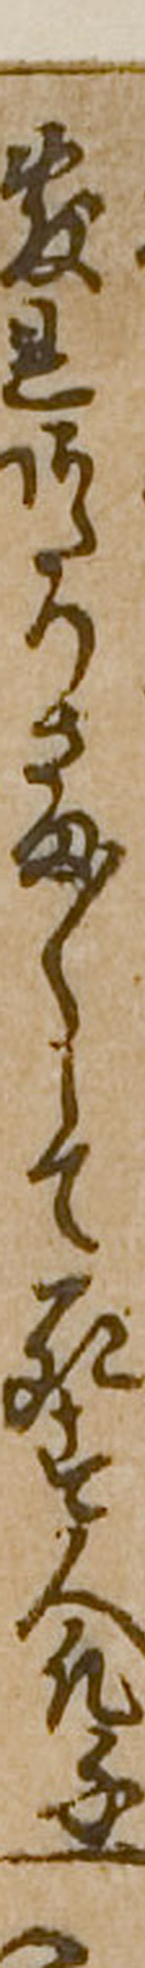敷れあたりさま〳〵にて死す人凡千
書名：[大坂つなみ]
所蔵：東京大学総合図書館 General Library in the University of Tokyo, JAPAN
